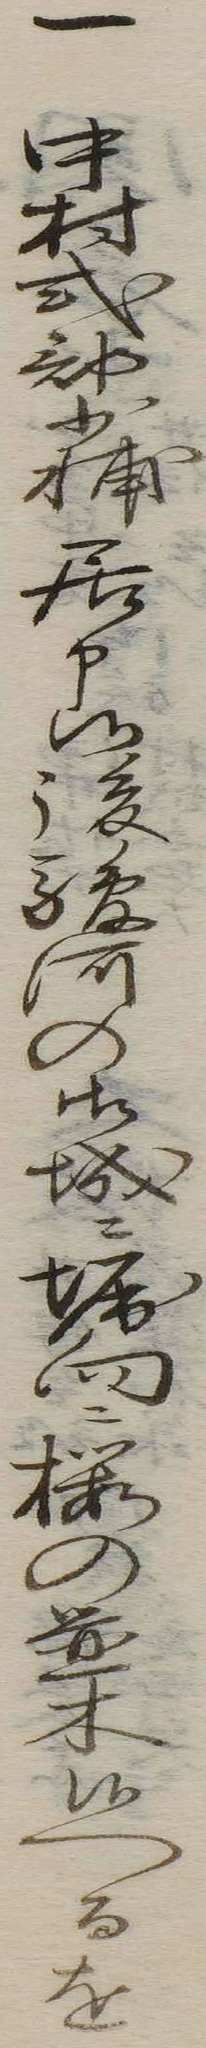一中村式部少輔居申候後駿河の御城に堀向に桜の並木候つるを
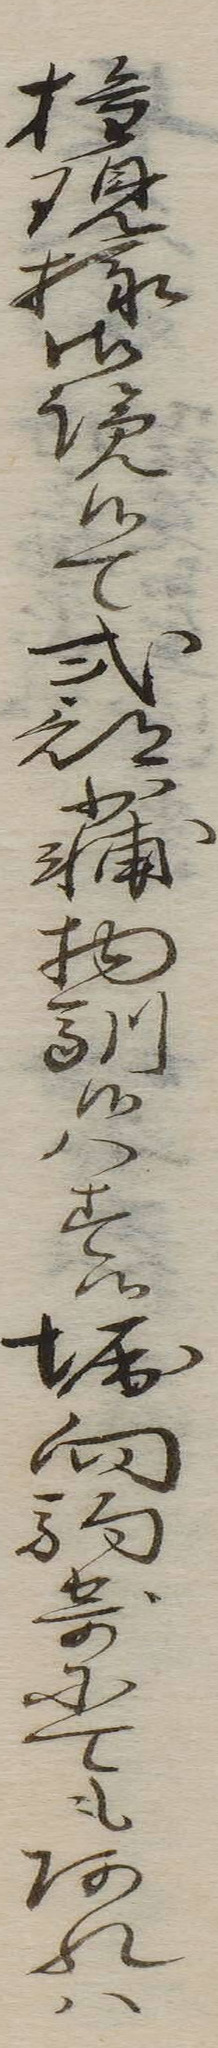権現様御覧候て式部少輔物馴候はす候堀向駒寄にてもあれは
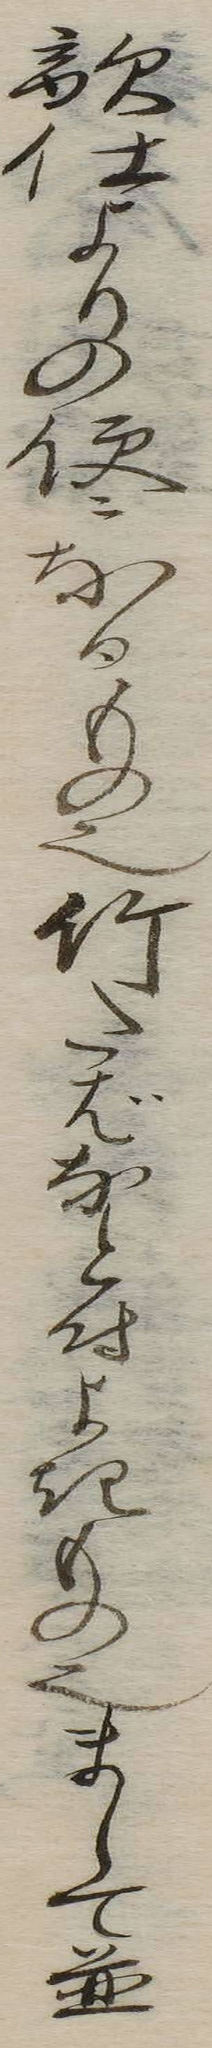敵仕よりの便になるもの也竹たばなと付よきもの也まして並
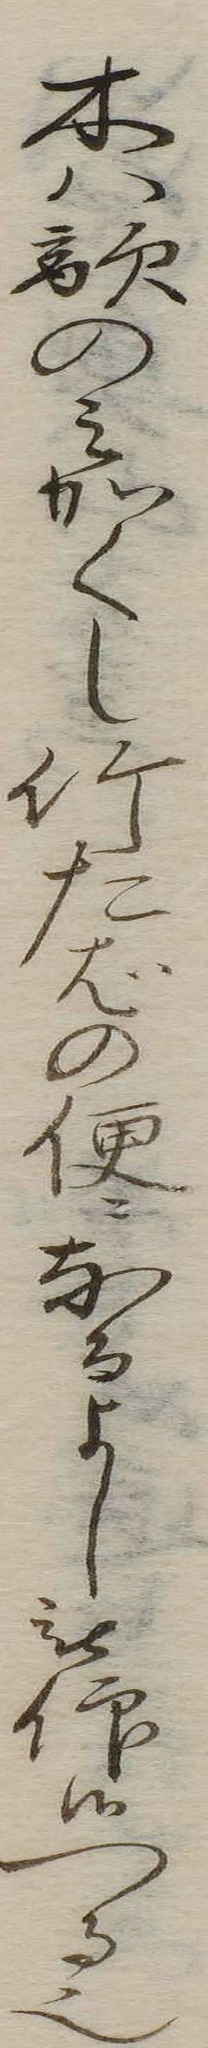木は敵のみかくし竹たばの便になるよし被仰候つる也
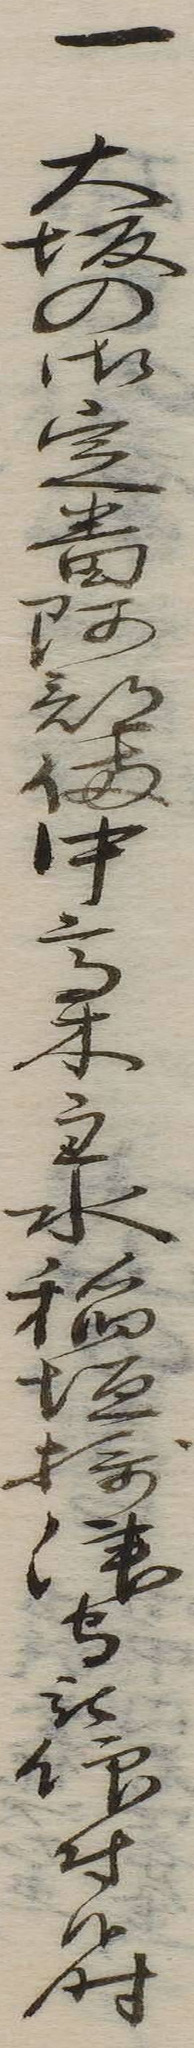一大坂の御定番阿部備中高木主水稲垣摂津守被仰付候時
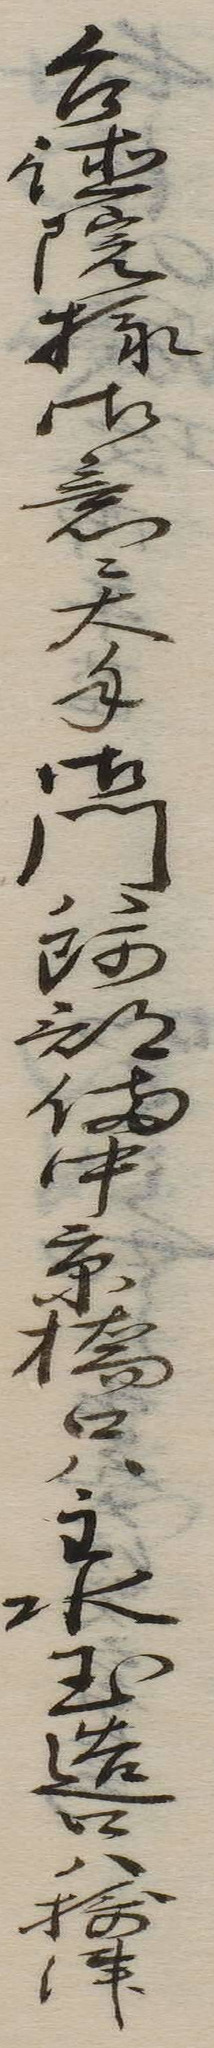台徳院様御意に大手御門は阿部備中京橋口は主水玉造口は摂津
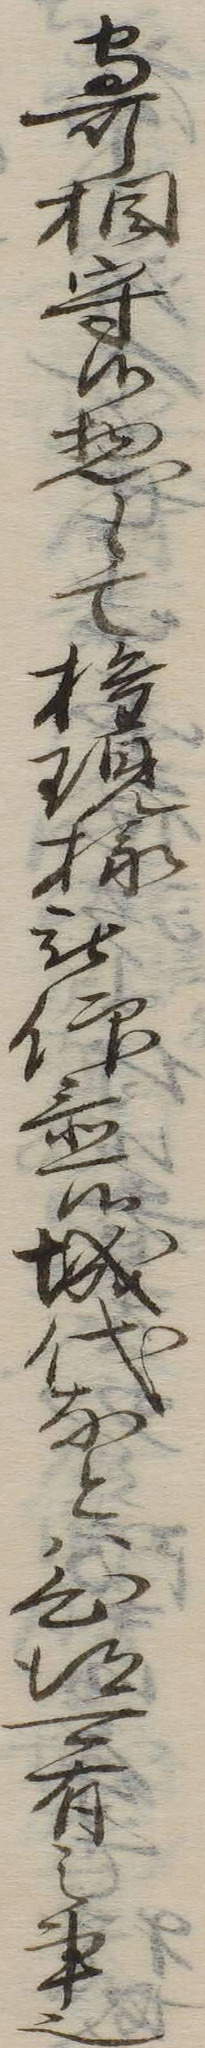守可相守候惣して権現様被仰置候城代なとは心得可有し事也
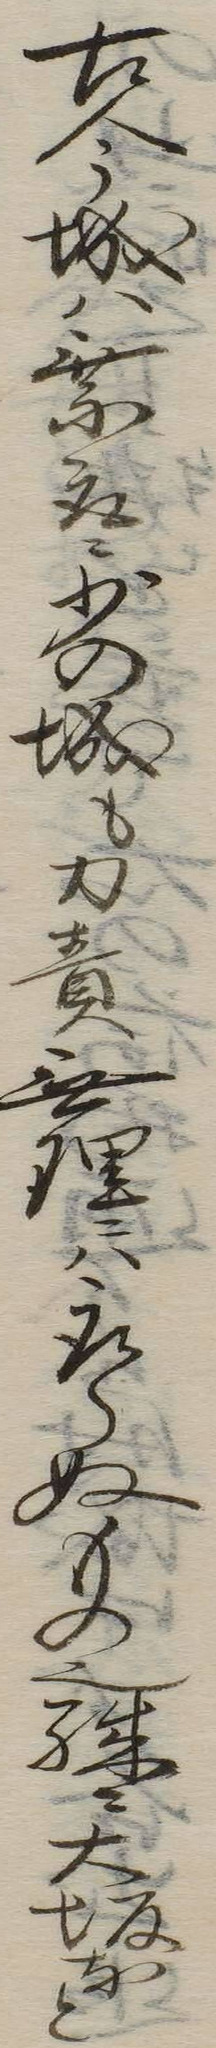古今城は乗取に少の城も力責無理には取らぬもの也殊に大坂なと
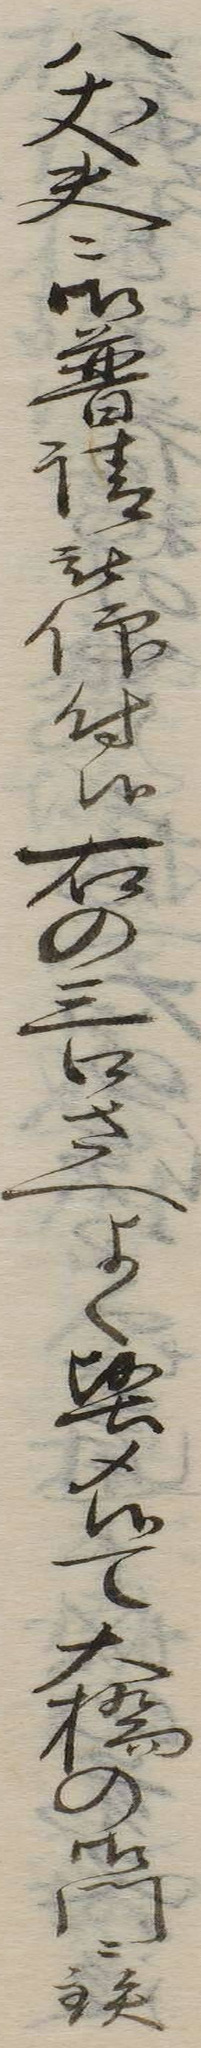は丈夫に御普請被仰付候右の三口さへよく堅め候て大橋の御門に鉄
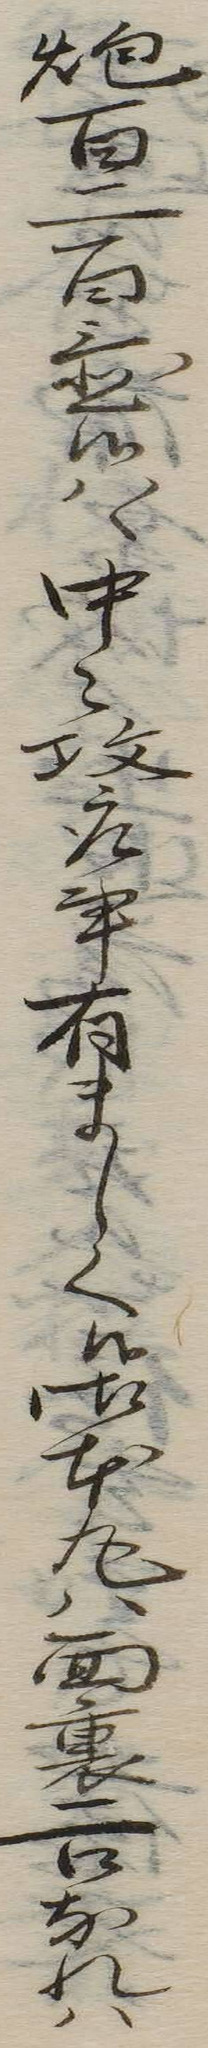炮百二百置候はゝ中々攻取事有ましく候御本丸は面裏二口なれは
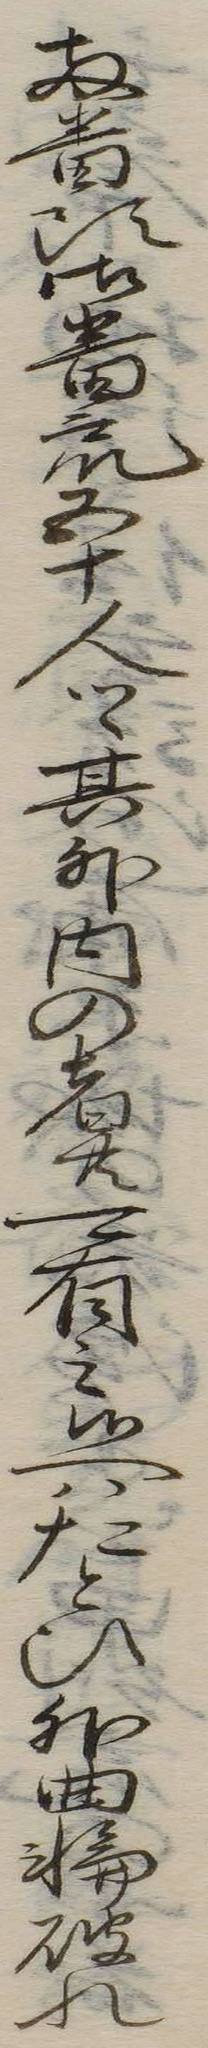両番頭御番衆五十人つゝ其外内の者共可有之候へはたとひ外曲輪破れ
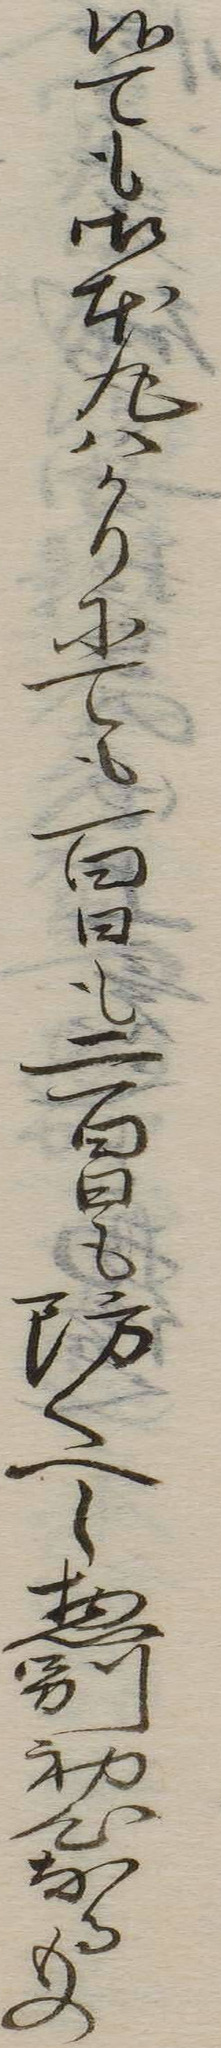候ても御本丸はかりにても百日も二百日も防くへし惣別初心なるもの
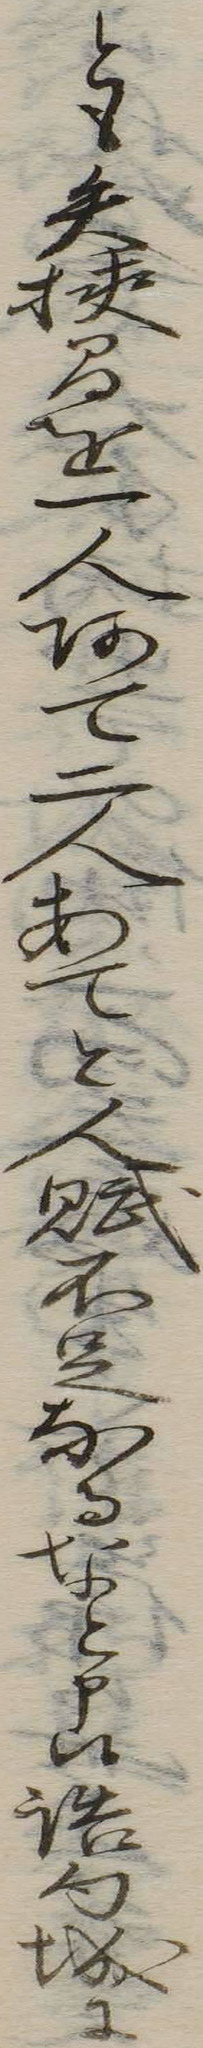とも矢狹間を一人あて二人あてと人賦不足なるなと申候詰句城に
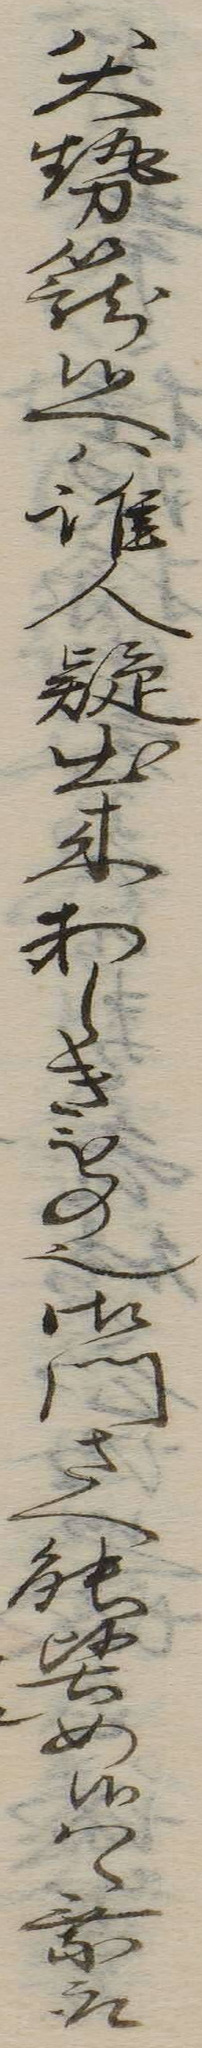は大勢籠候へは誰人疑出来あしきもの也御門さへ能堅め候はゝ乗取
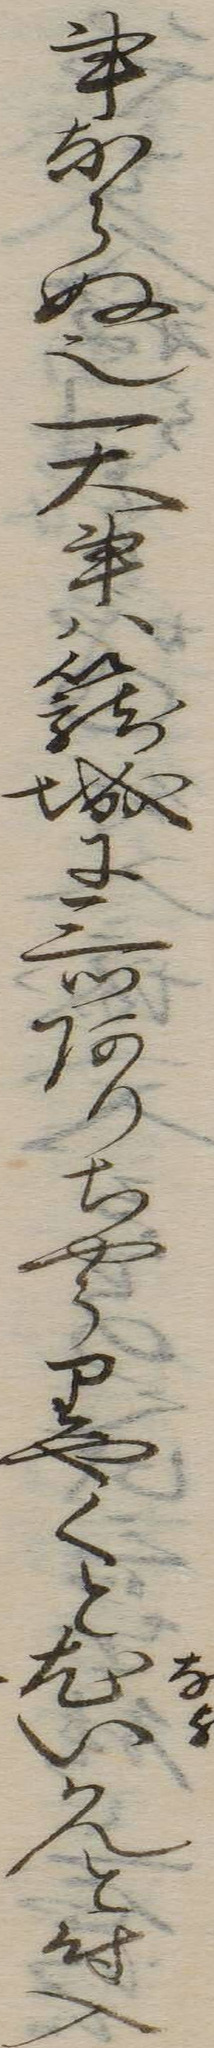事ならぬ也一大事は籠城に三つありちやうりやくと尤いかんと付入
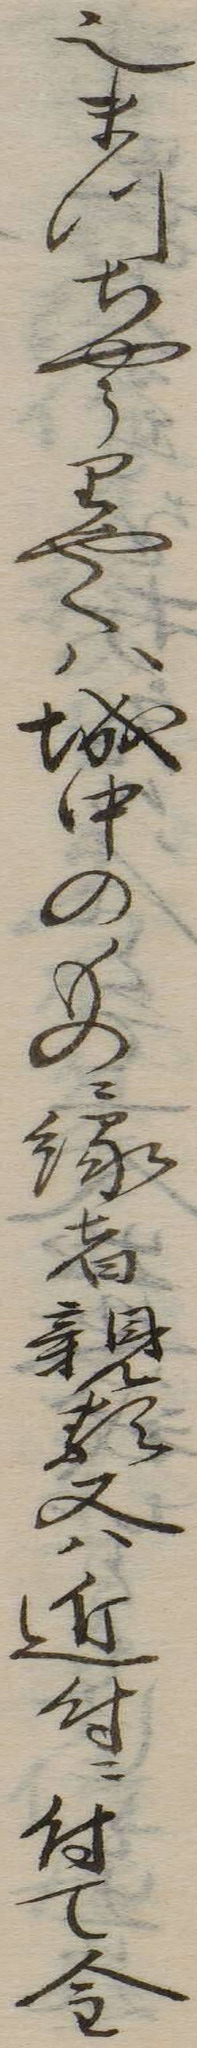也まつちやうりやくは城中のものに縁者親類又は近付に付て金
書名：三河之物語
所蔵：国文学研究資料館
